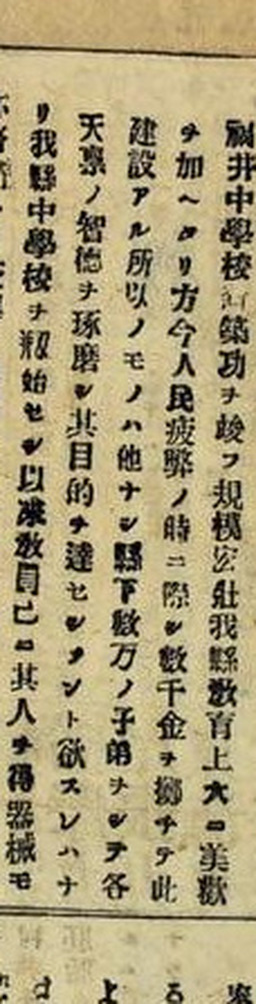建設アル所以ノモノハ他ナシ県下数万ノ子弟ヲシテ各
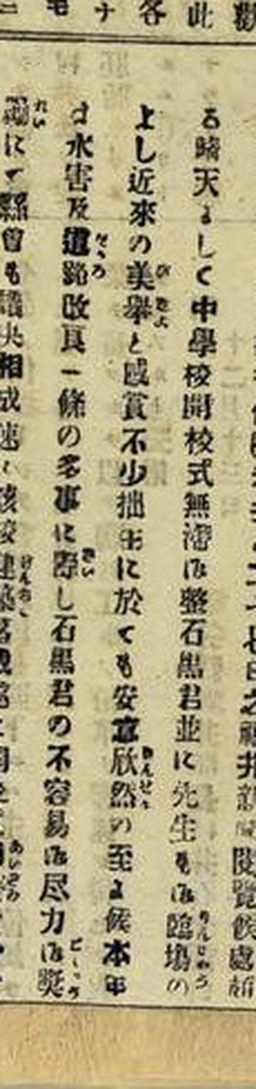よし近来の美挙と感賞不少拙子に於ても安意欣然の至に候本年
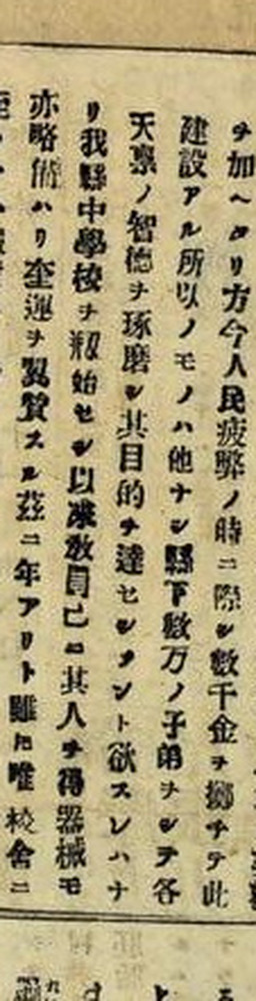天稟ノ智徳ヲ琢磨シ其目的ヲ達セシメント欲スレハナ
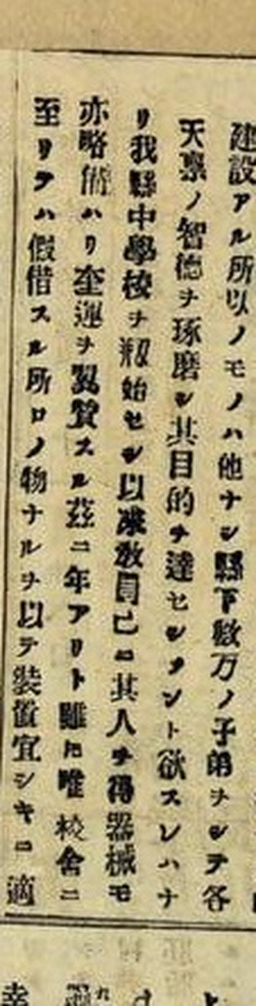リ我県中学校ヲ剏始セシ以来教員已ニ其人ヲ得器械モ
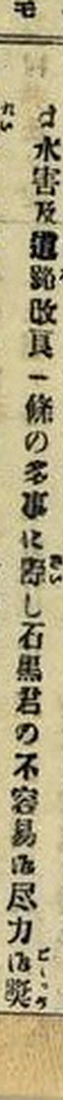は水害及道路改良一條の多事に際し石黒君の不容易御尽力御奨
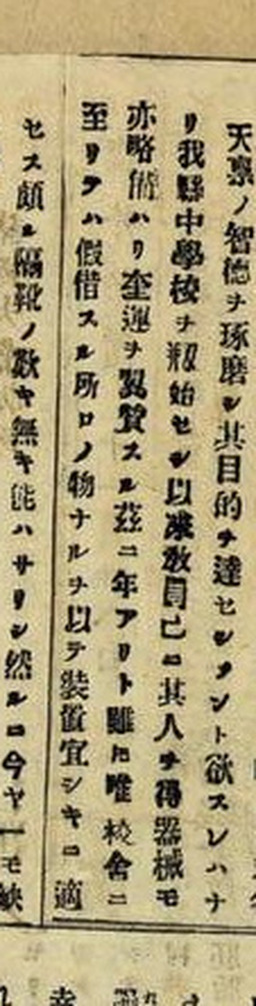亦略備ハリ奎運ヲ翼賛スル茲ニ年アリト雖トモ唯校舎ニ
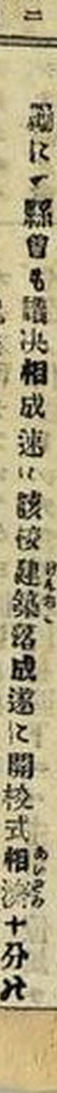励にて県会も議決相成速に該校建築落成遂に開校式相済十分の
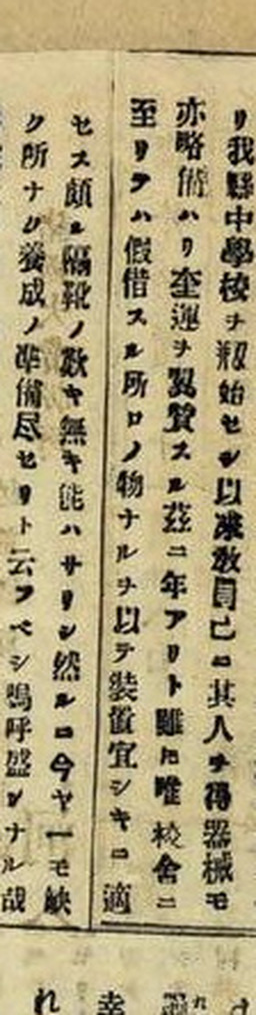至リテハ假借スル所ロノ物ナルヲ以テ装置宜シキニ適
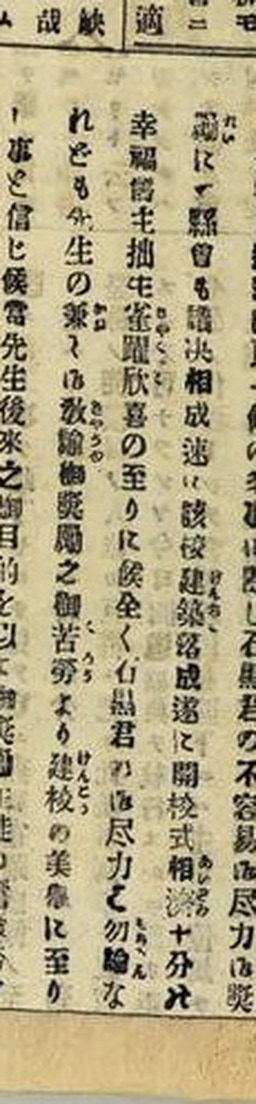幸福旧主拙生雀躍欣喜の至りに候全く石黒君の御尽力は勿論な
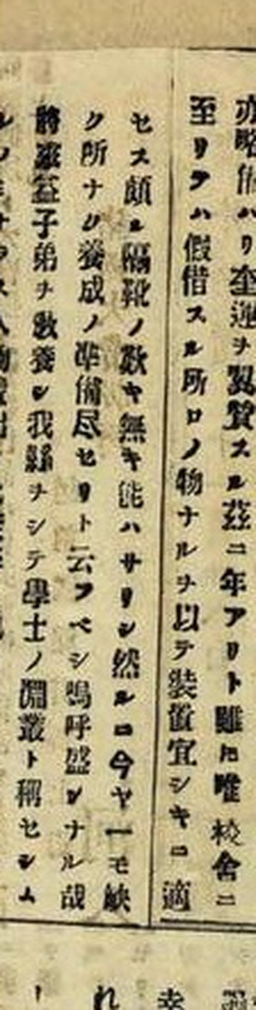セス頗ル隔靴ノ嘆キ無キ能ハサリシ然ルニ今ヤ一モ欠
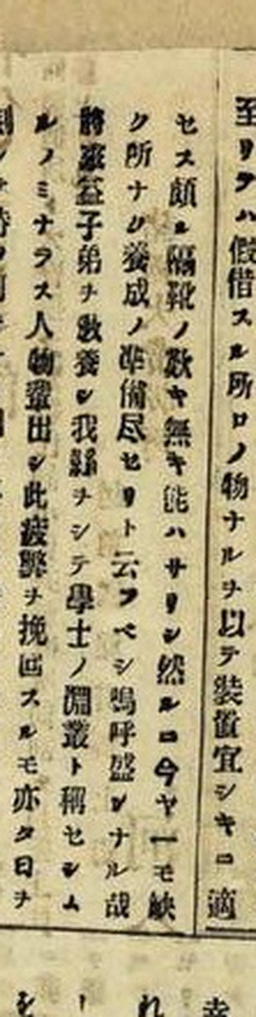ク所ナク養成ノ準備尽セリト云フベシ嗚呼盛ンナル哉
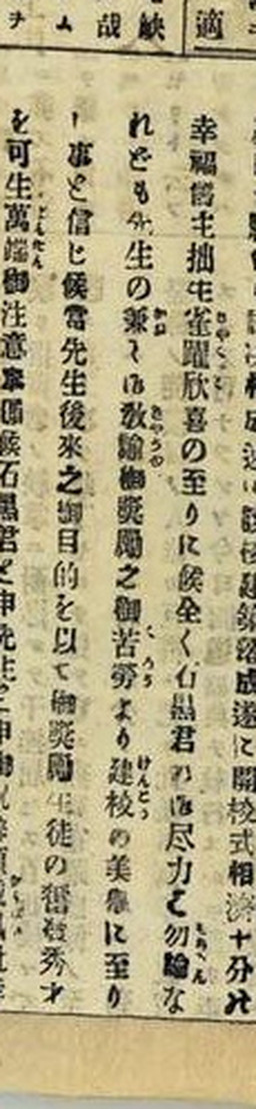れども先生の兼て御教諭御奨励之御苦労より建校の美挙に至り
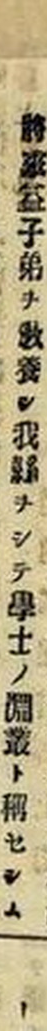将来益子弟ヲ教養シ我県ヲシテ学士ノ淵叢ト称セシム
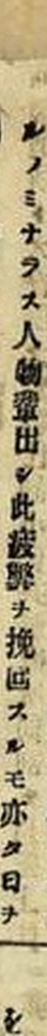ルノミナラス人物輩出シ此疲弊ヲ挽回スルモ亦タ日ヲ
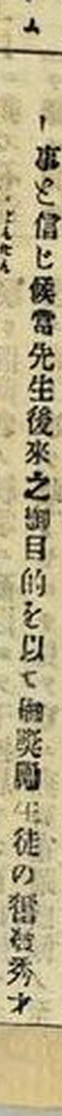候事と信じ候当先生後来之御目的を以て御奨励生徒の奮発秀才
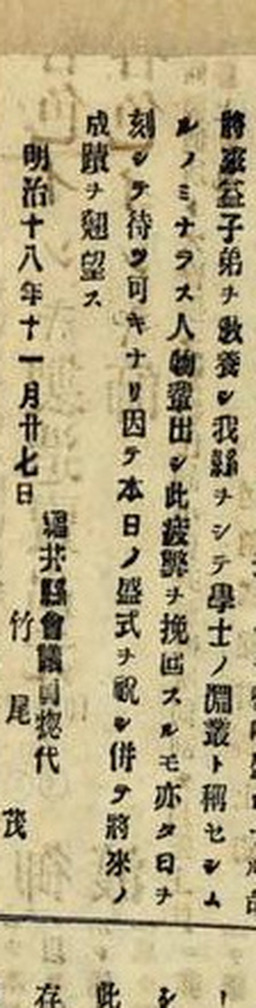刻シテ待ツ可キナリ因テ本日ノ盛式ヲ祝シ併テ将来ノ
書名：温古集 五巻
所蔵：福井県文書館 Fukui Prefectural Archives
